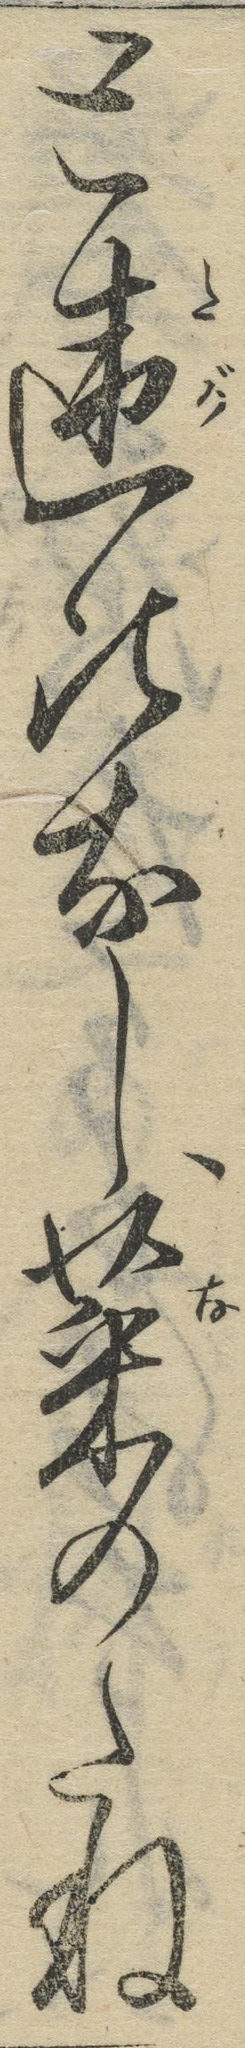と違ひなし、菜のたね
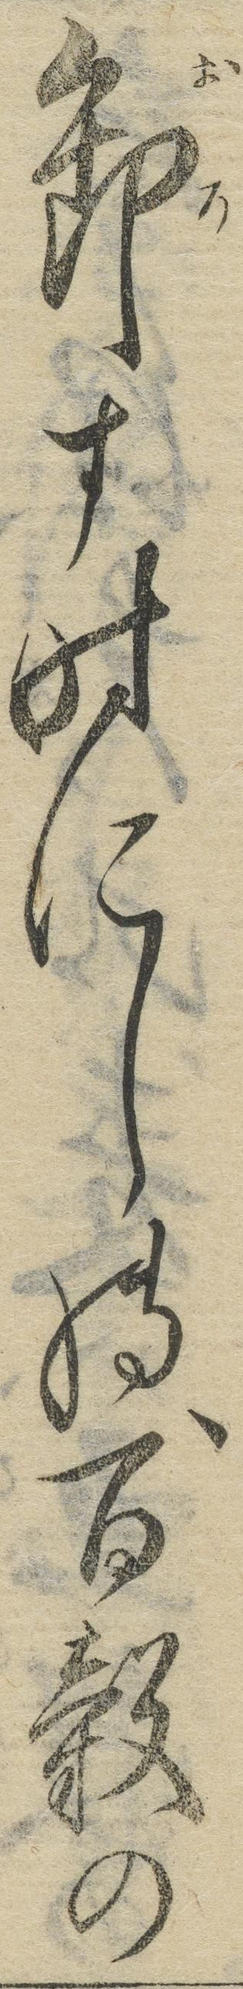卸す時にして、百穀の
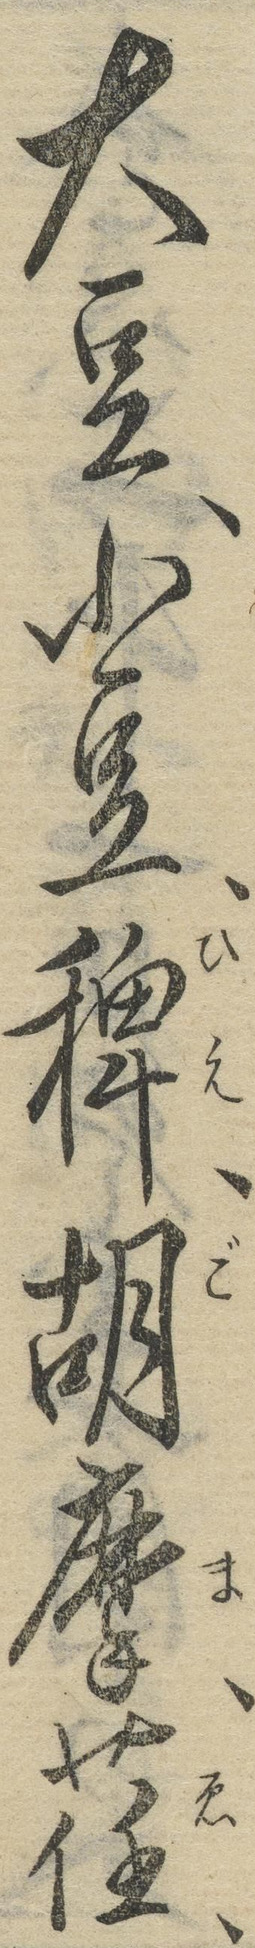大豆、小豆、稗、胡摩、荏、

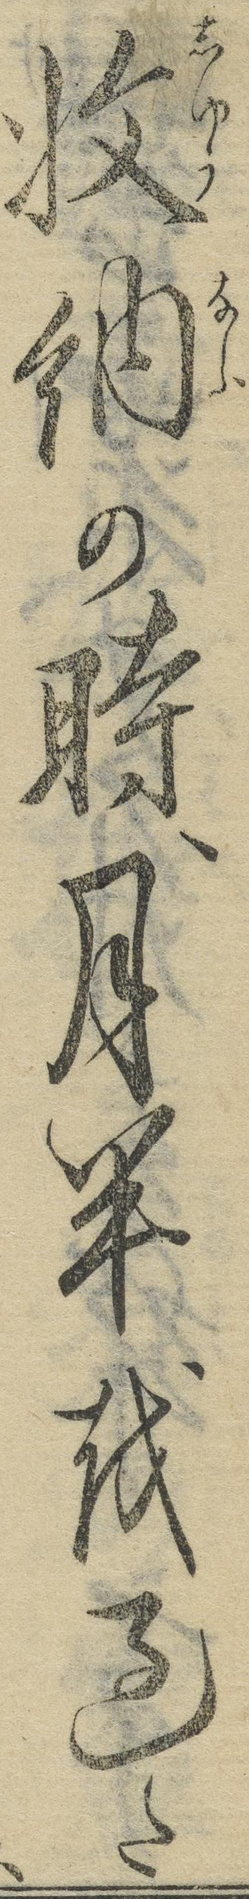収納の時、月半を過た
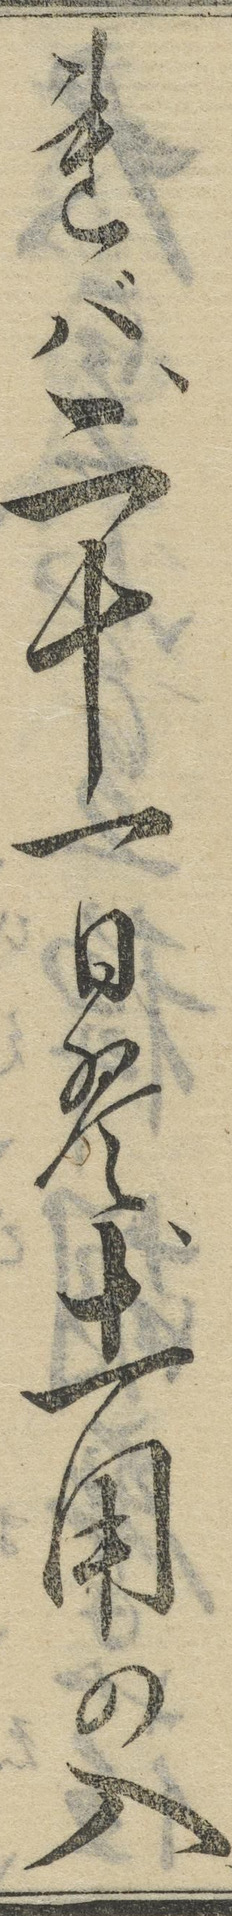れば、二十一日は、土用の入、
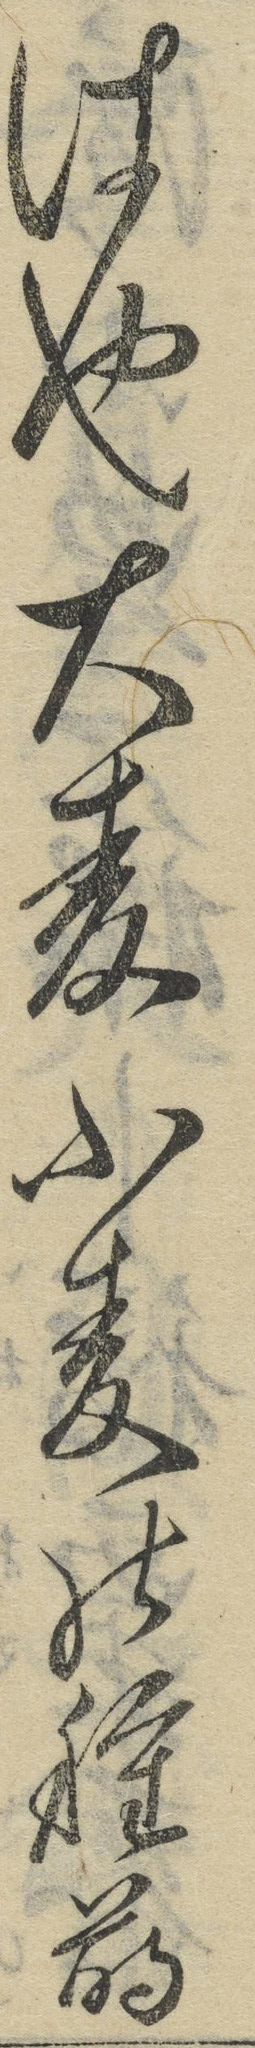はや大麦小麦の種蒔
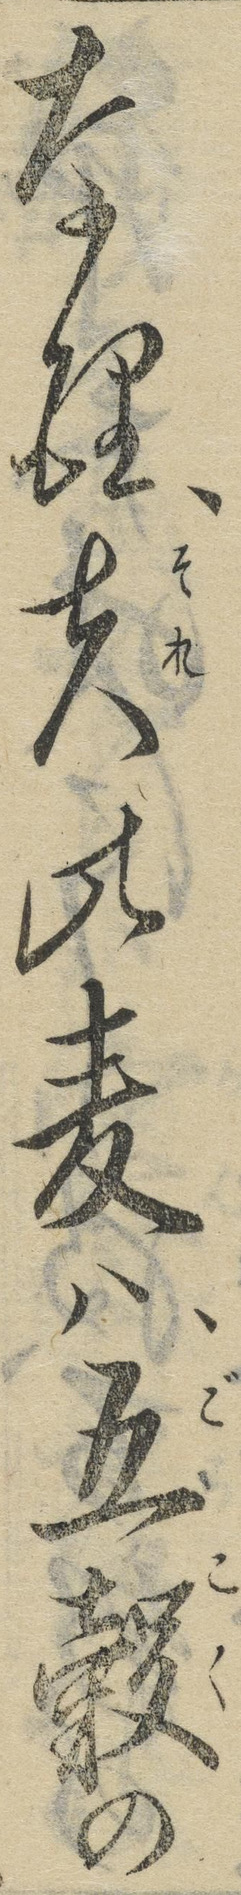なり、夫此麦は、五穀の
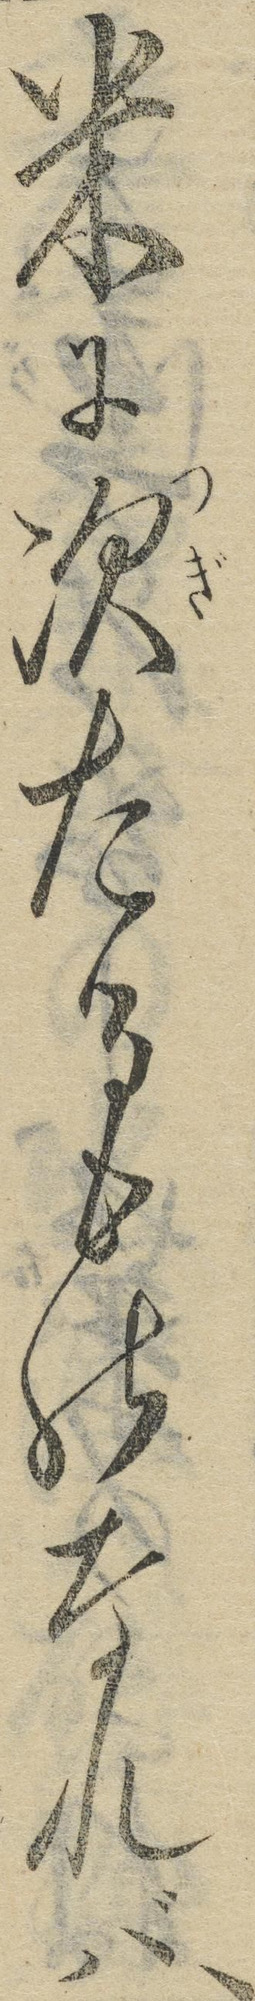米に次たるものなれば、
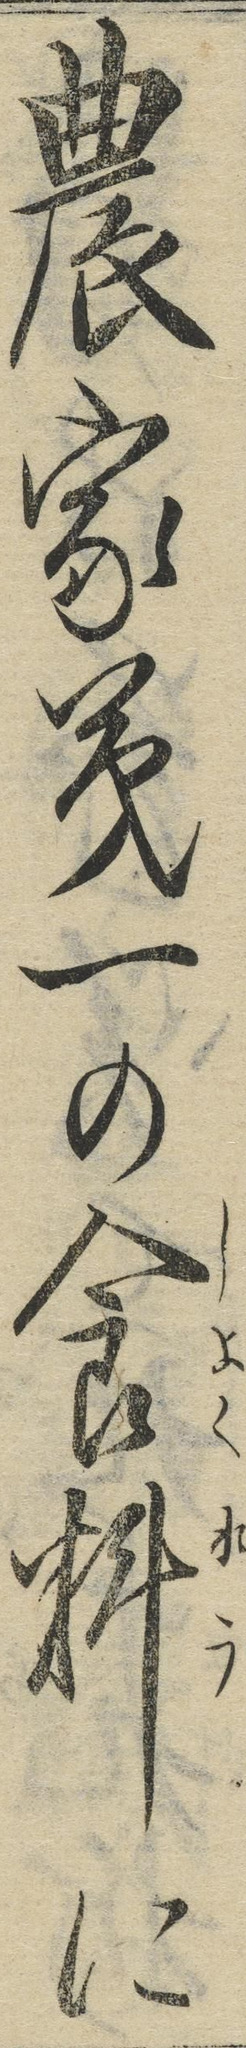農家第一の食料に
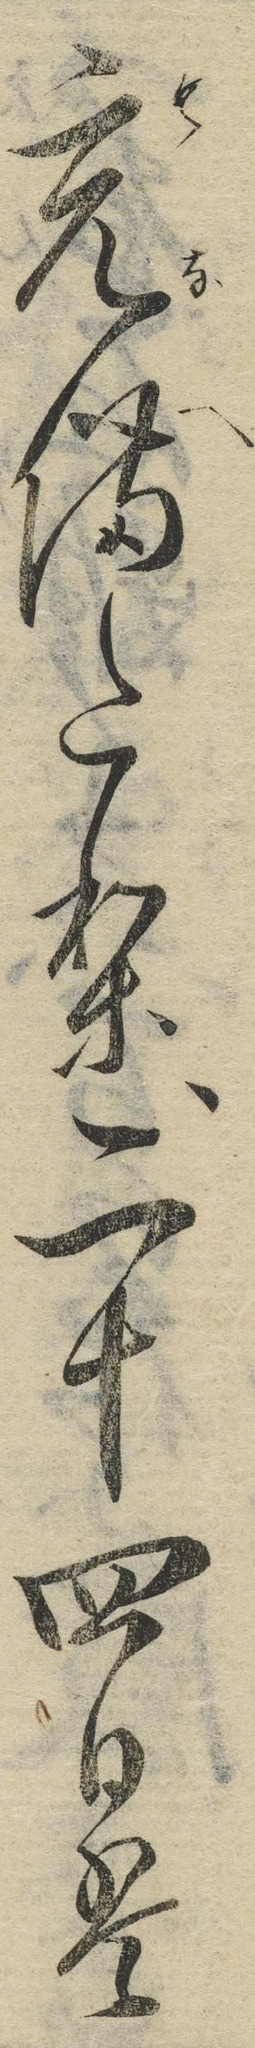充備たり、二十四日は
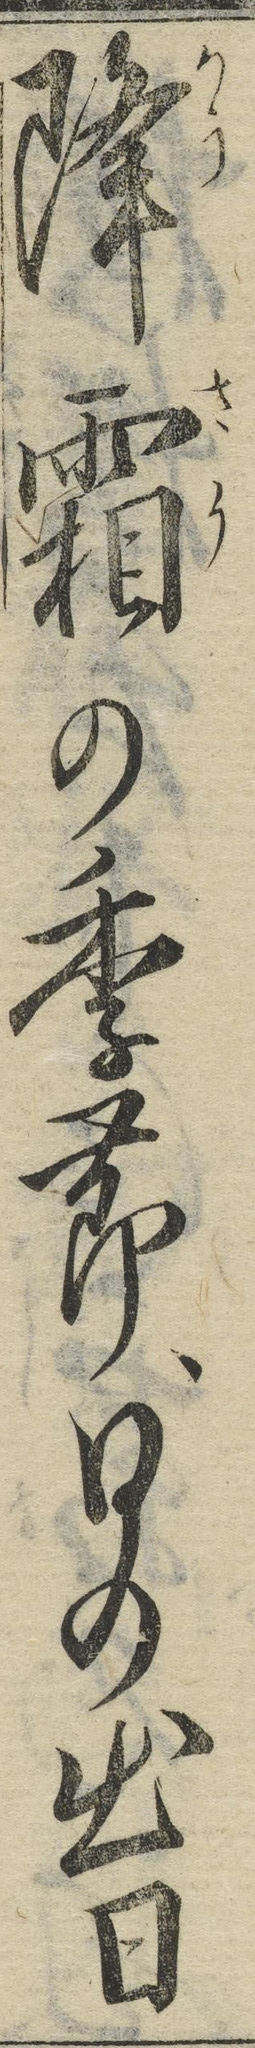降霜の季節、日の出日
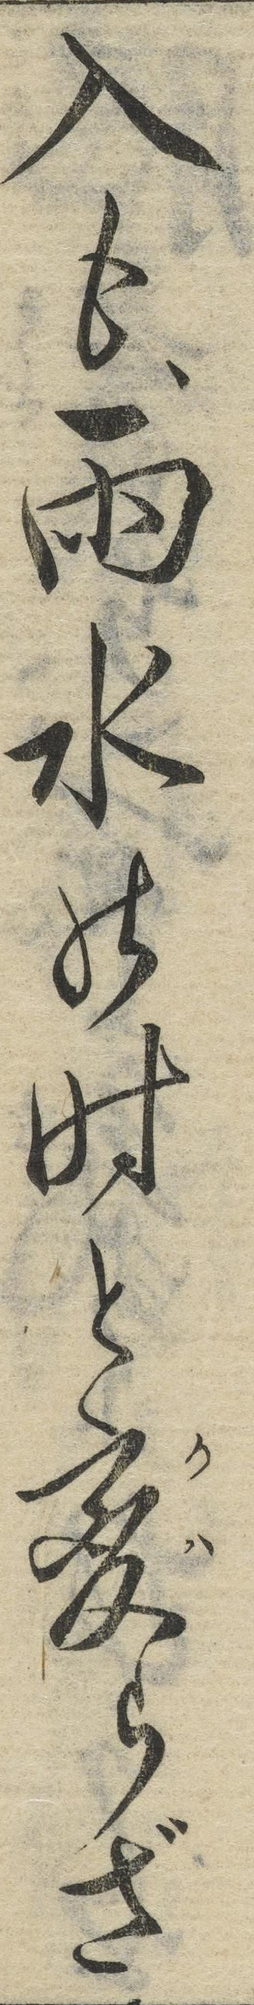入も、雨水の時と変らざ
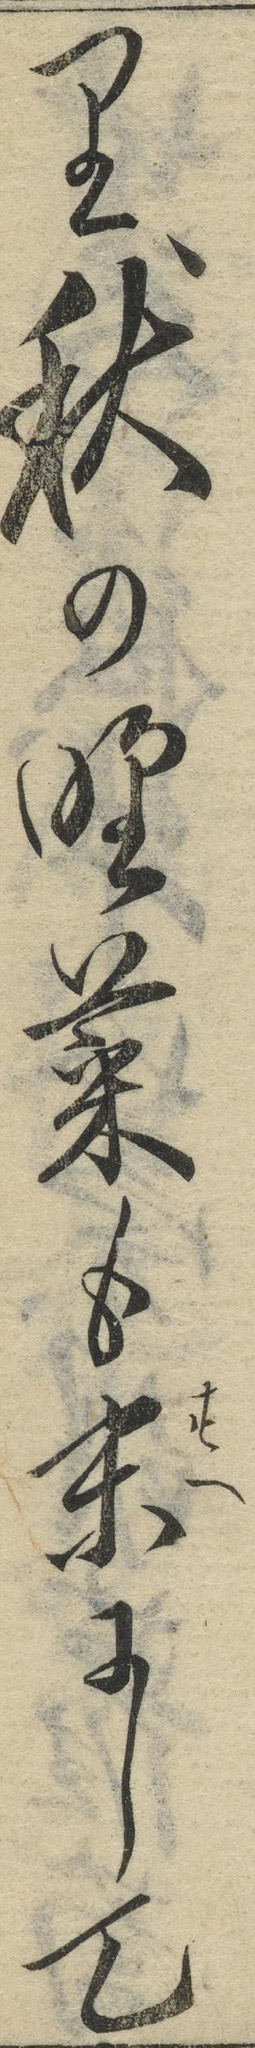り、秋の野菜も末にして

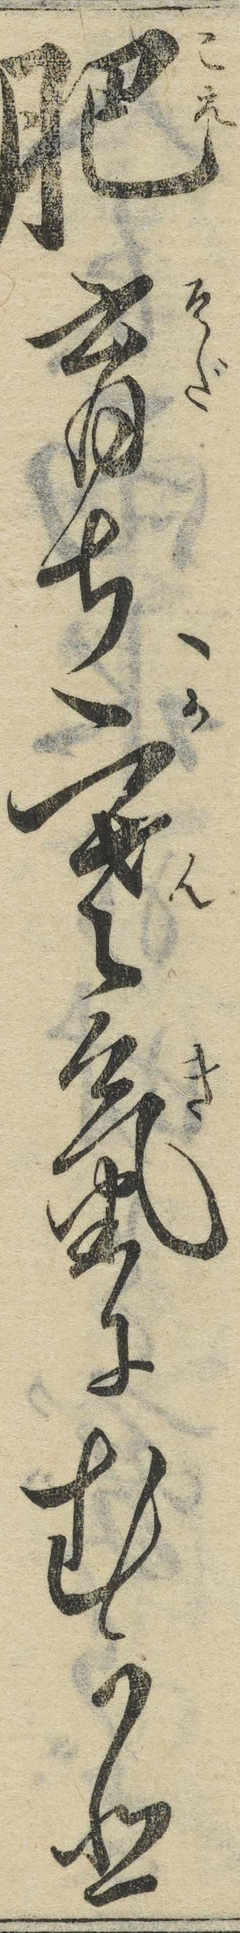肥育ち、寒気にむかひ
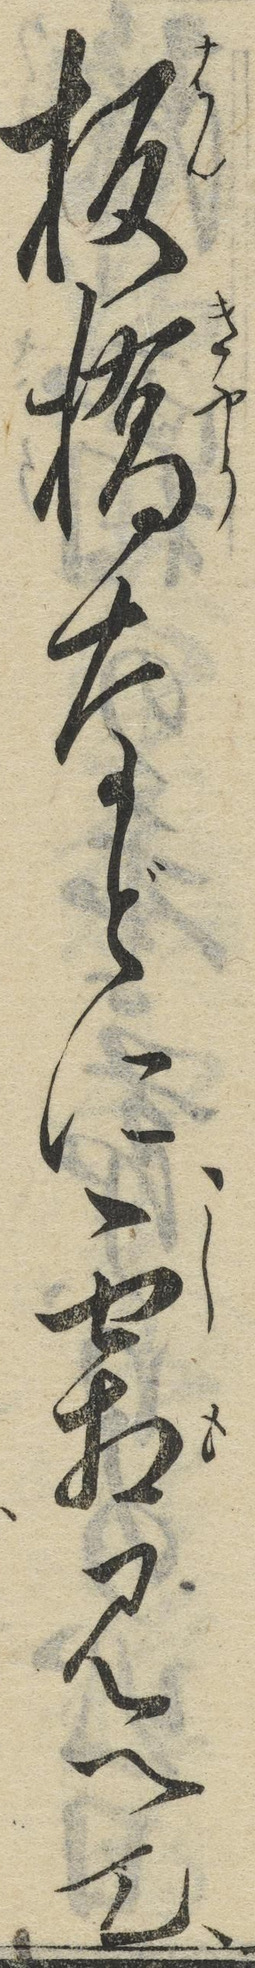板橋などに、霜見へて、
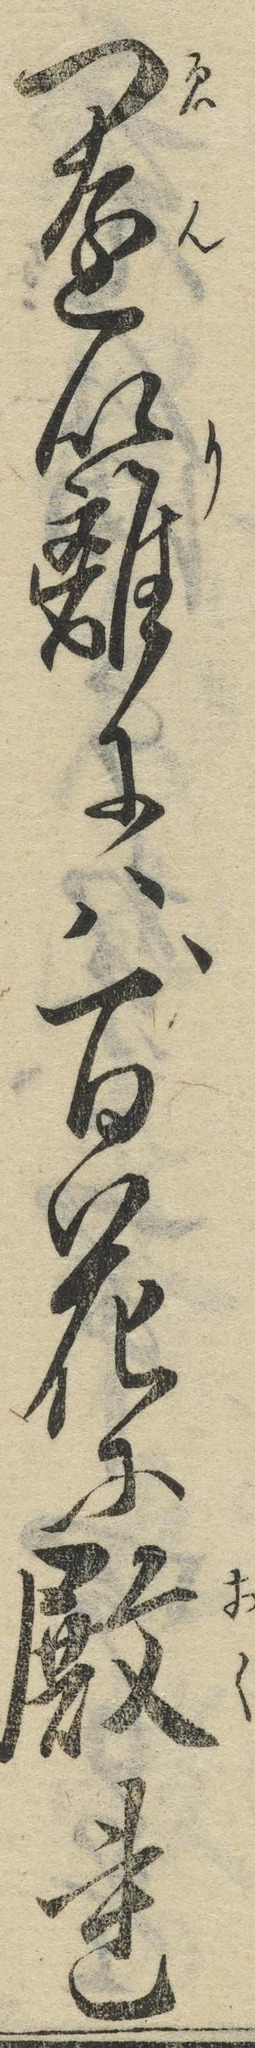牆籬には、百花に殿れ
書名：暦日往来　單
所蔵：東京大学地震研究所図書室 Earthquake Research Institute Library, The University of Tokyo, JAPAN
